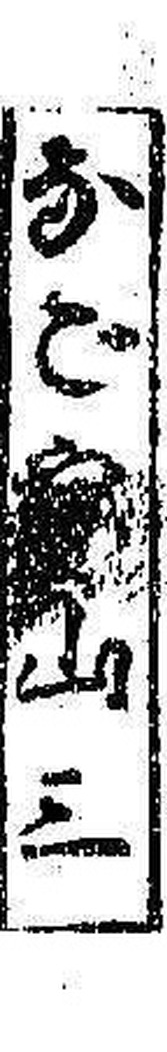なご家山三
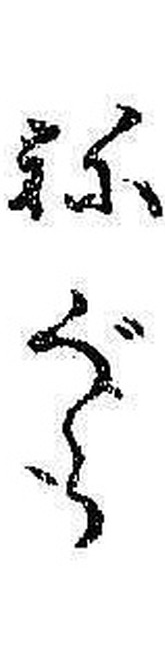ねぐら
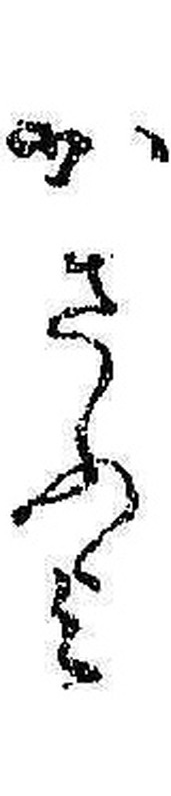かさふよ
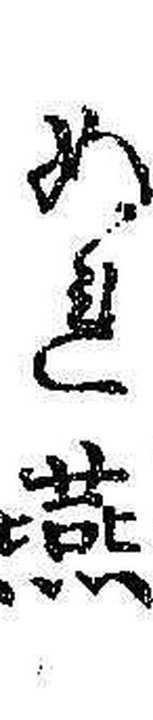ぬれ燕
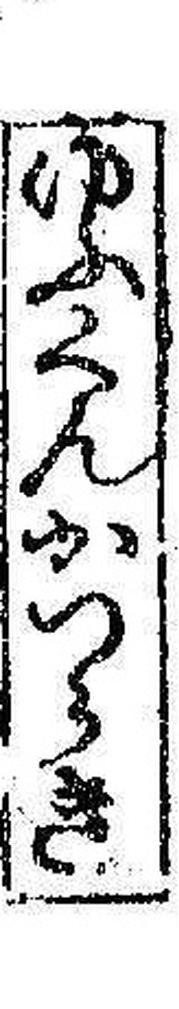ゆふくんかつらき
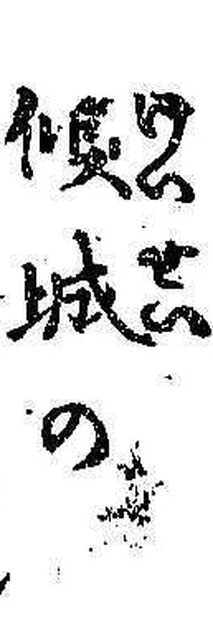傾城の
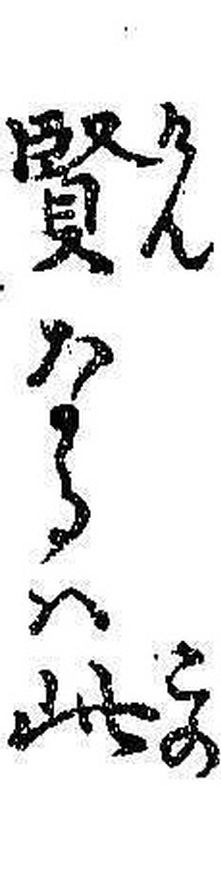賢なるは此
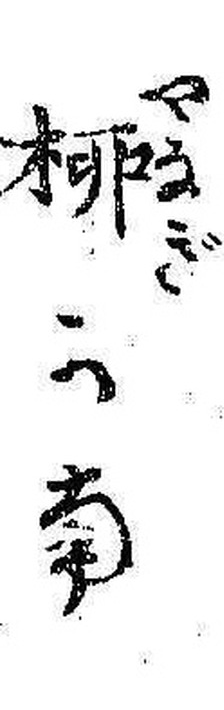柳かな

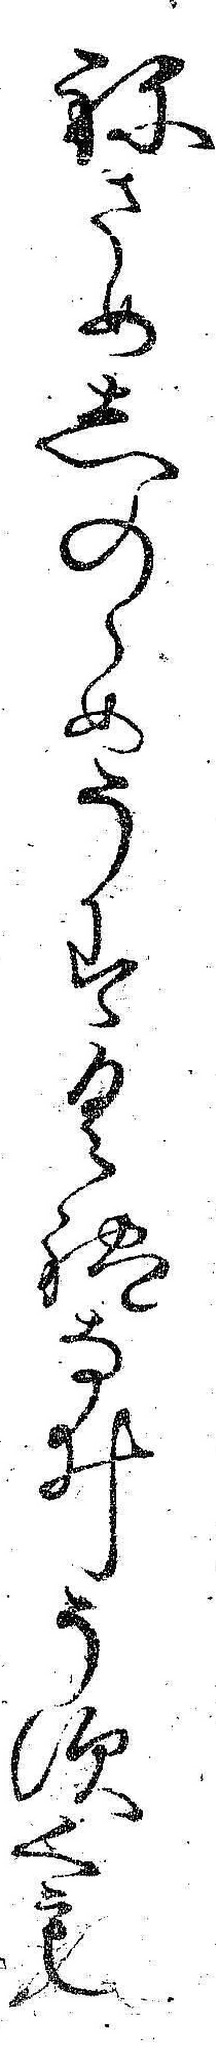ねさめしのゝめうすくれなゐうすくも
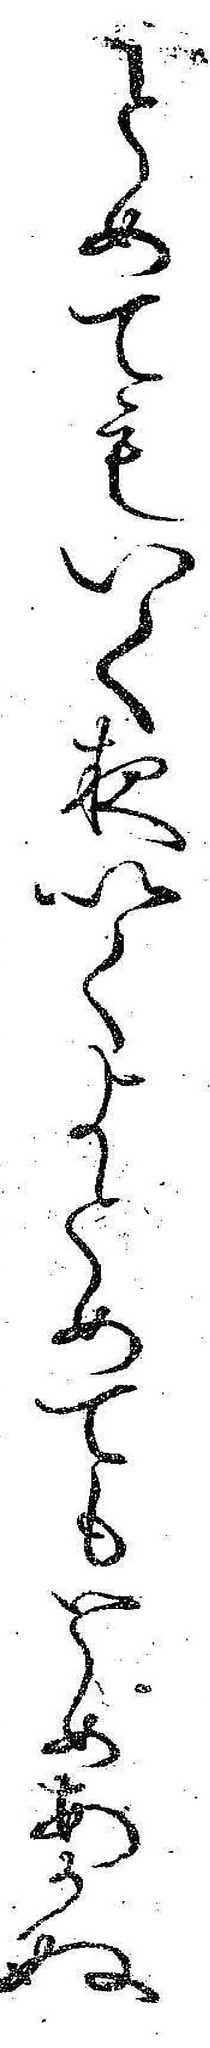とめてもいく夜いくよとめてもとめあかぬ
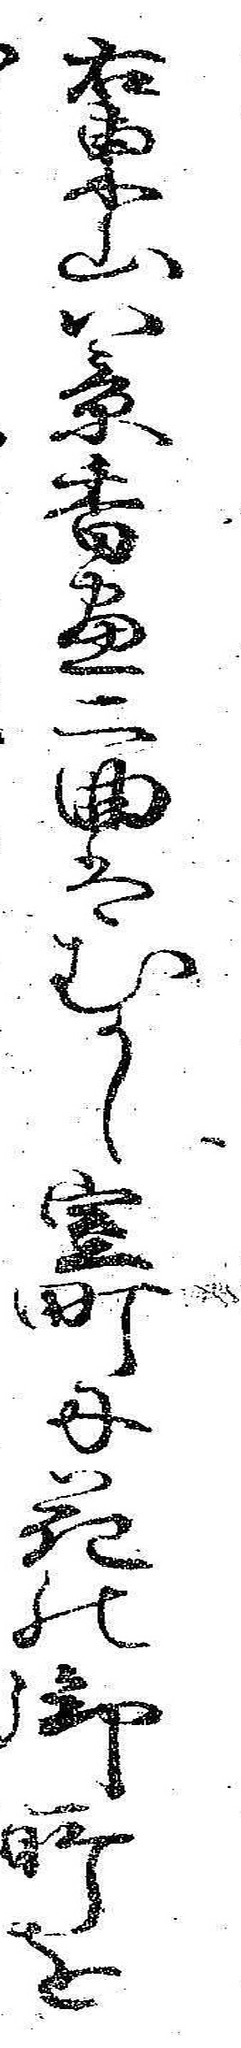右東山八景香尽二曲はむかし室町に花の御所を
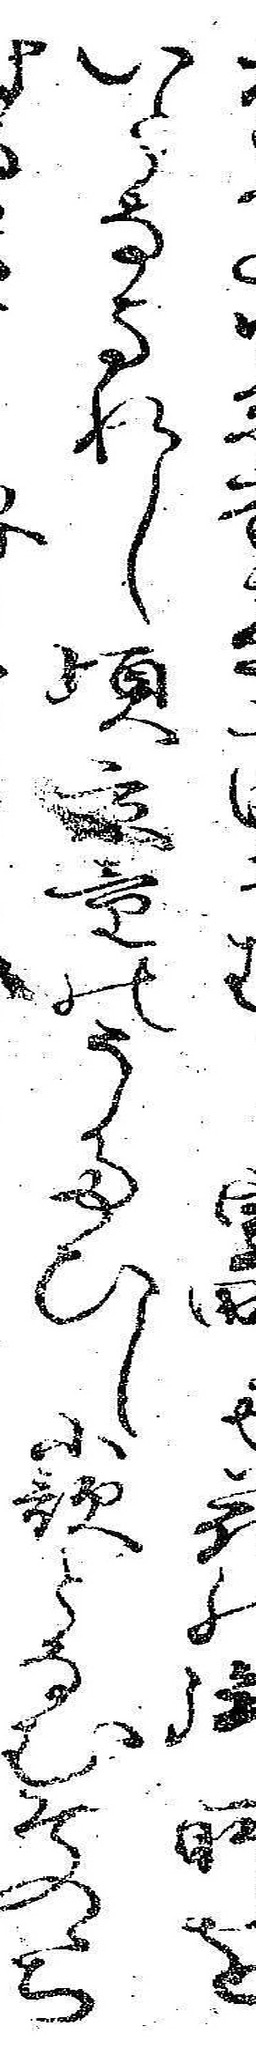いとなまれし頃京童のうたひし小歌となむそのゝち
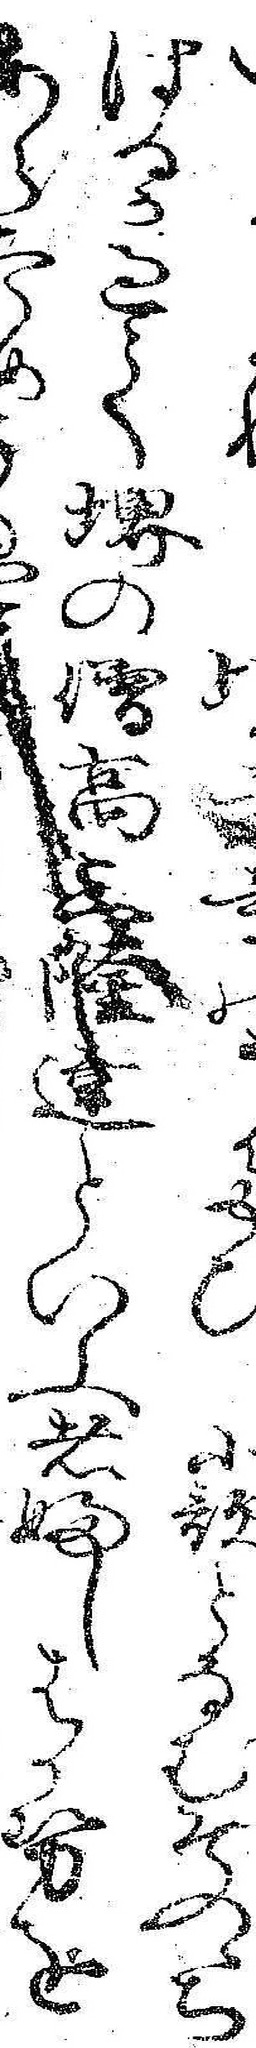はるか過て堺の僧高三隆達といふ者ふしはかせを
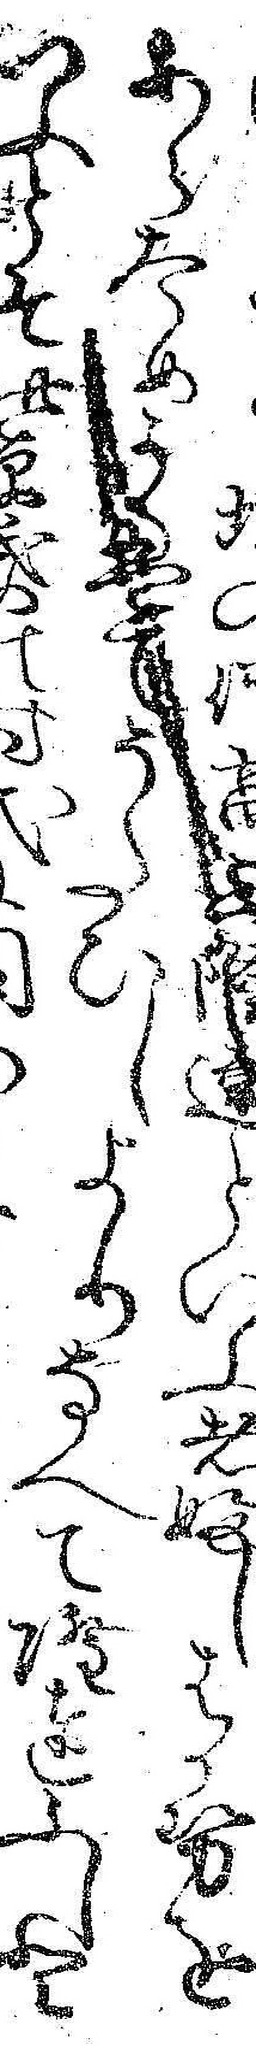あらためかへてうたひしよりなへて隆達ふしと
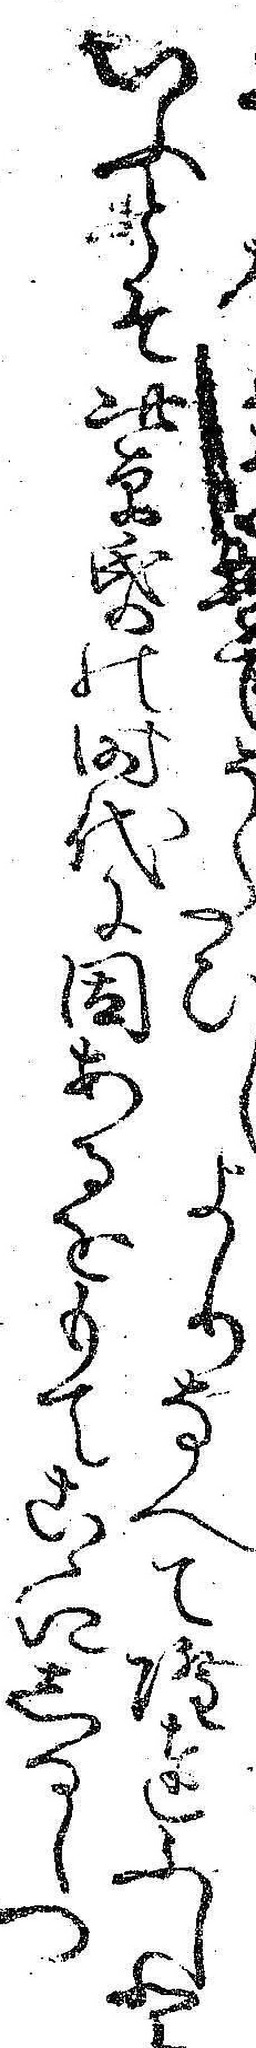いふとそ此草紙の時代に因あるをもてこゝにしるしつ
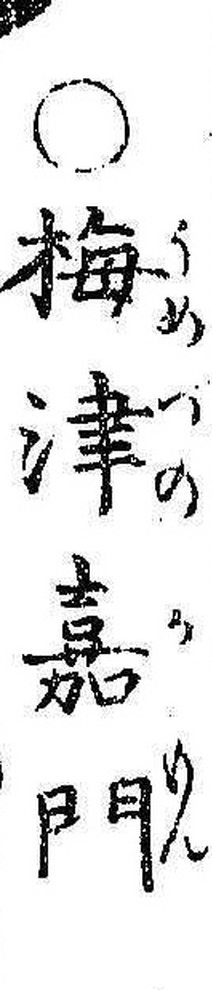○梅津嘉門
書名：昔話稲妻表紙
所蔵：国文学研究資料館
